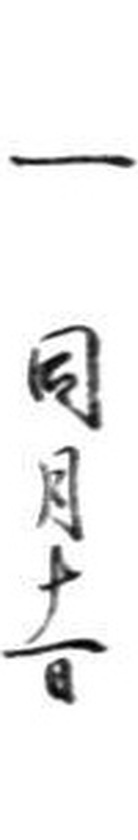一同月十一日

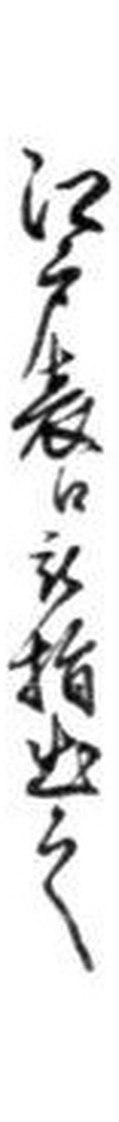江戸表江被指出之
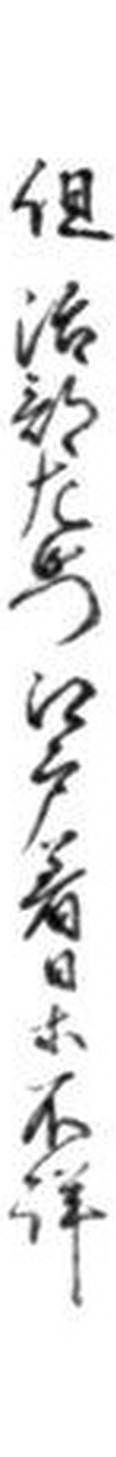但治部左衛門江戸着日等不詳
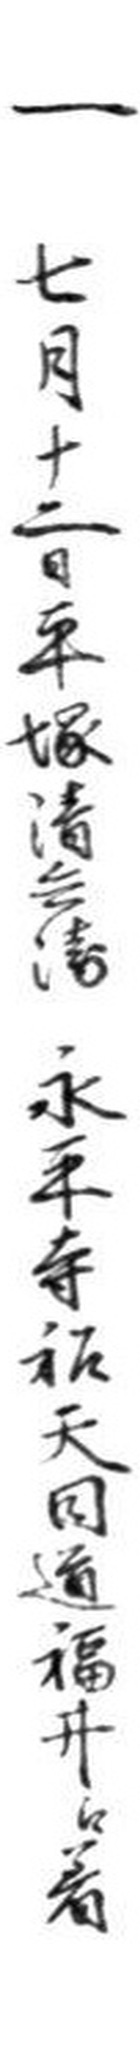一七月十二日平塚清兵衛永平寺祚天同道福井江着
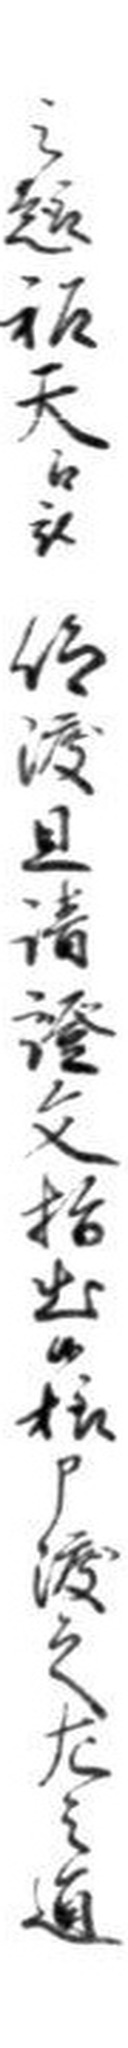之趣祚天江被仰渡且請証文指出候様申渡之左之通
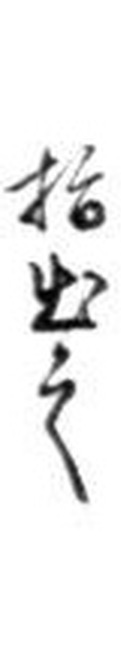指出之
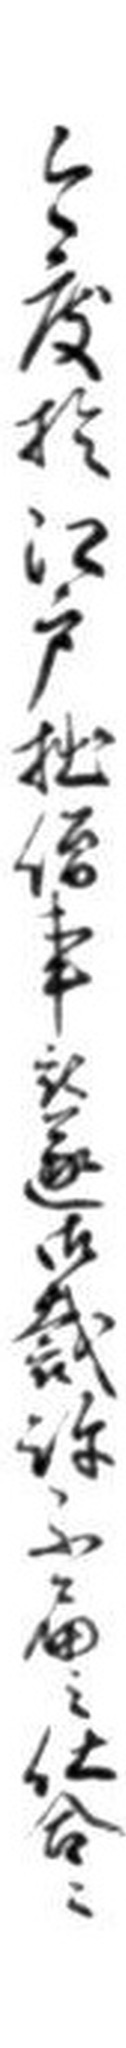今度於江戸拙僧事被遂御裁許不届之仕合ニ
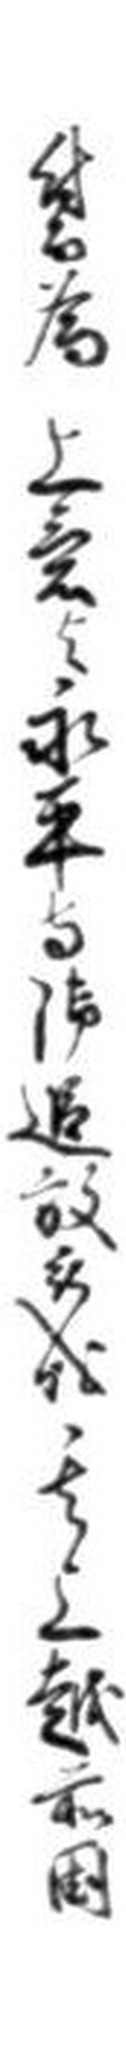付而為上意与永平寺御追放被成其上越前国
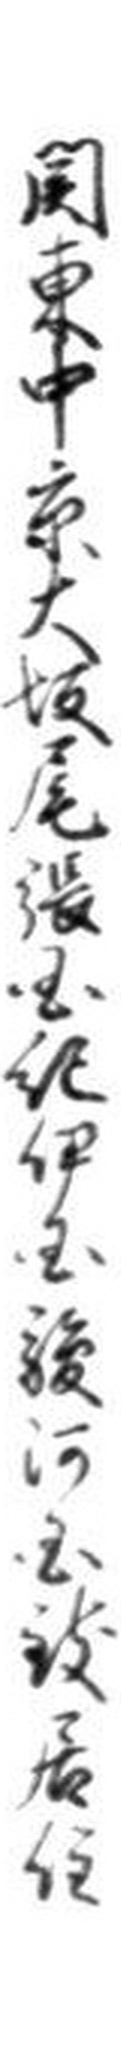関東中京大坂尾張国紀伊国駿河国致居住
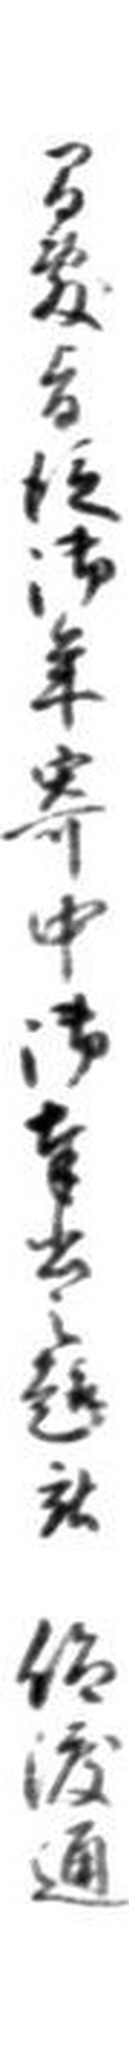間敷旨従御年寄中御奉書之趣被仰渡通
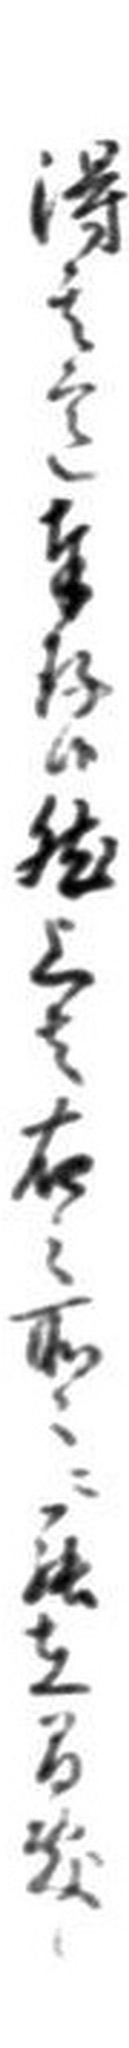得其意奉存候然上は右之所々ニ罷在間敷候
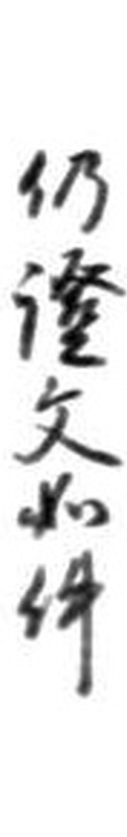仍証文如件
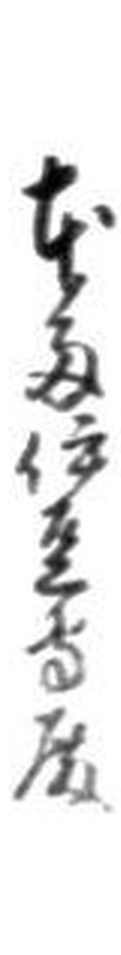本多伊豆守殿
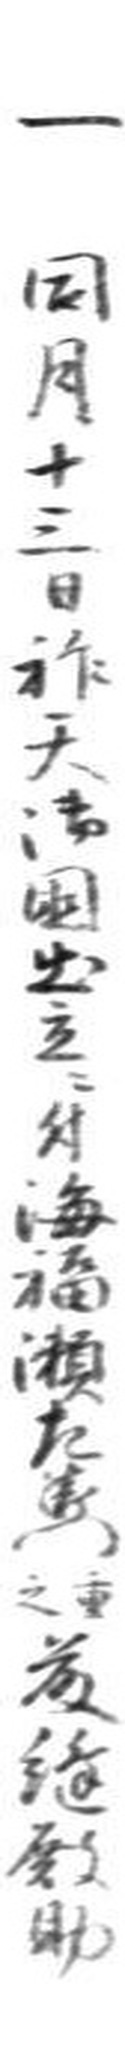一同月十三日祚天御国出立ニ付海福瀬左衛門重之藤縫殿助
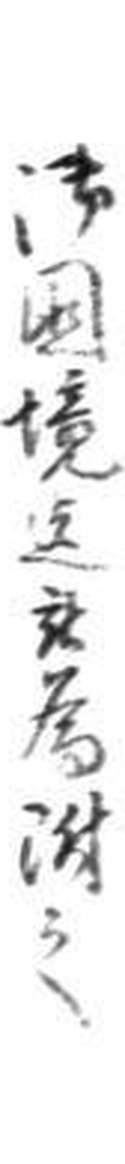御国境迄被為附之

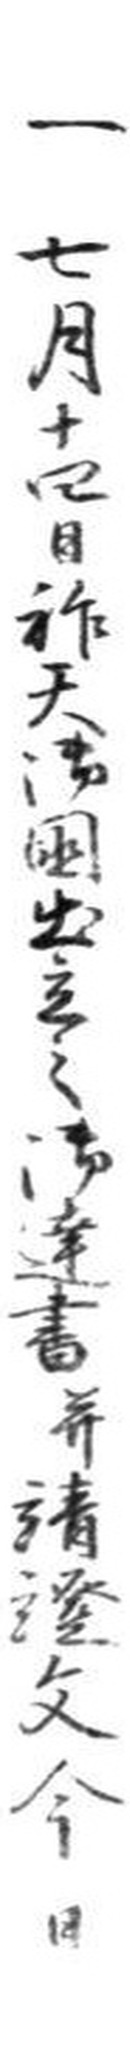一七月十四日祚天御国出立之御達書并請証文今日
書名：家譜 三 忠昌公 従慶長八年到寛永六年
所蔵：福井県文書館 Fukui Prefectural Archives
